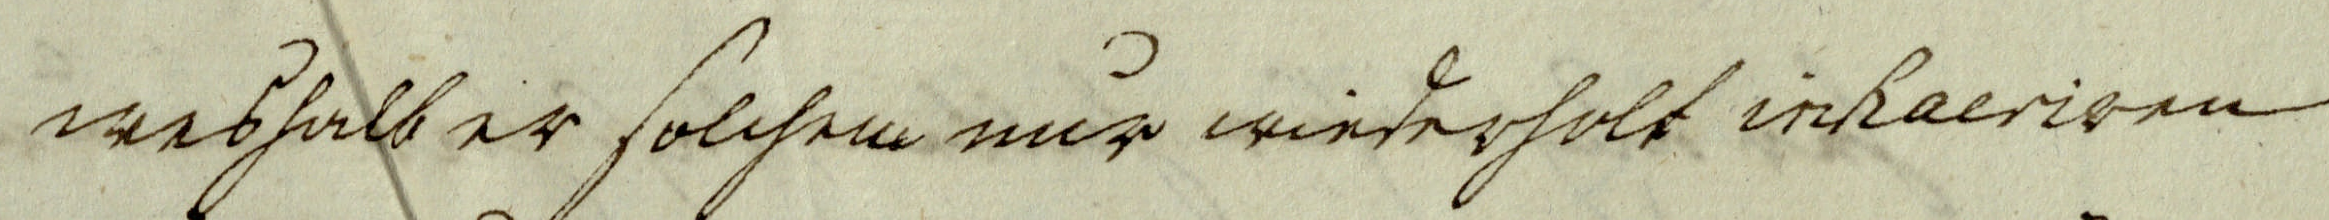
weshalb er solchem nur wiederholt inhaeriren
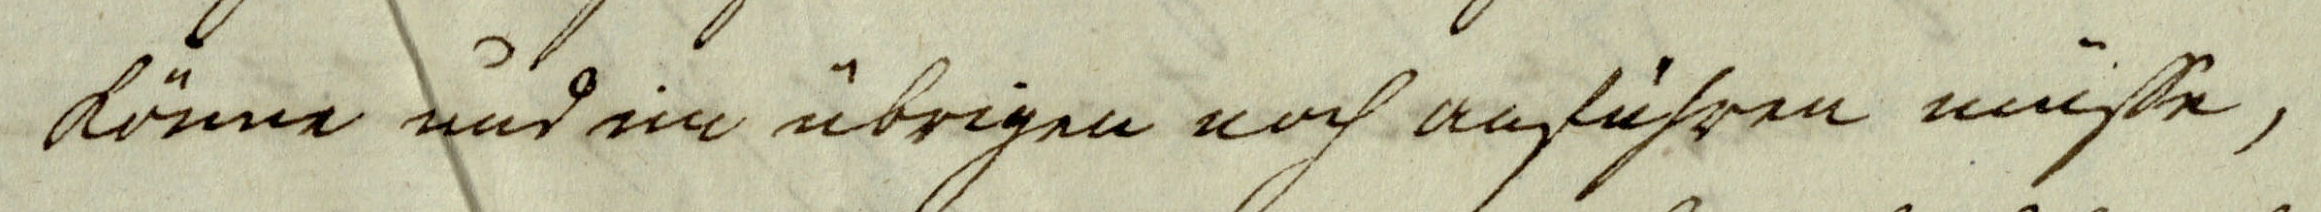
könne und im übrigen noch anführen müsse,
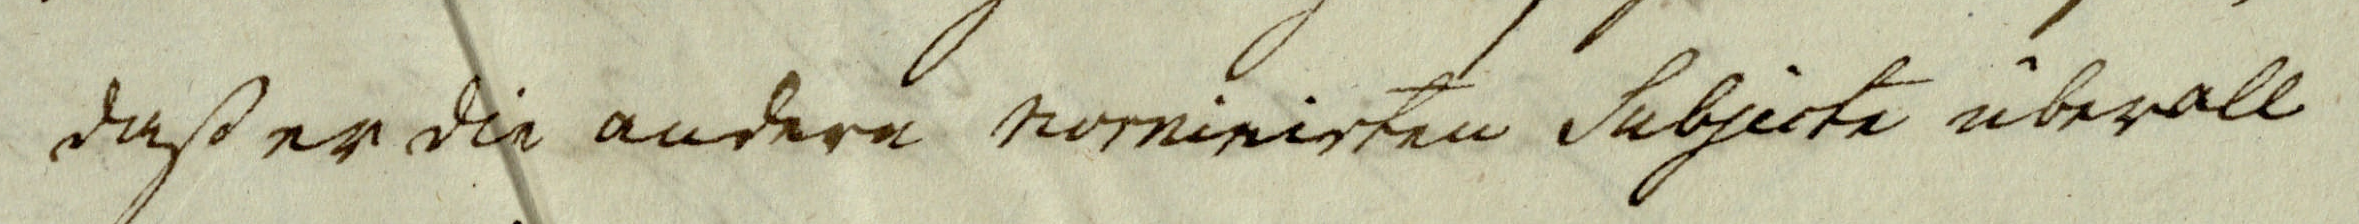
daß er die andere nominirten Subjecte überall
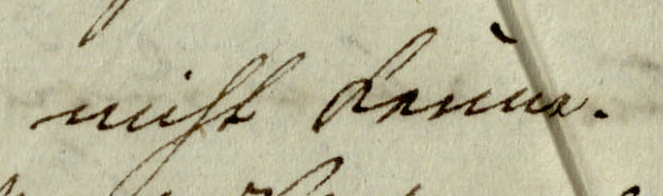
nicht kenne.
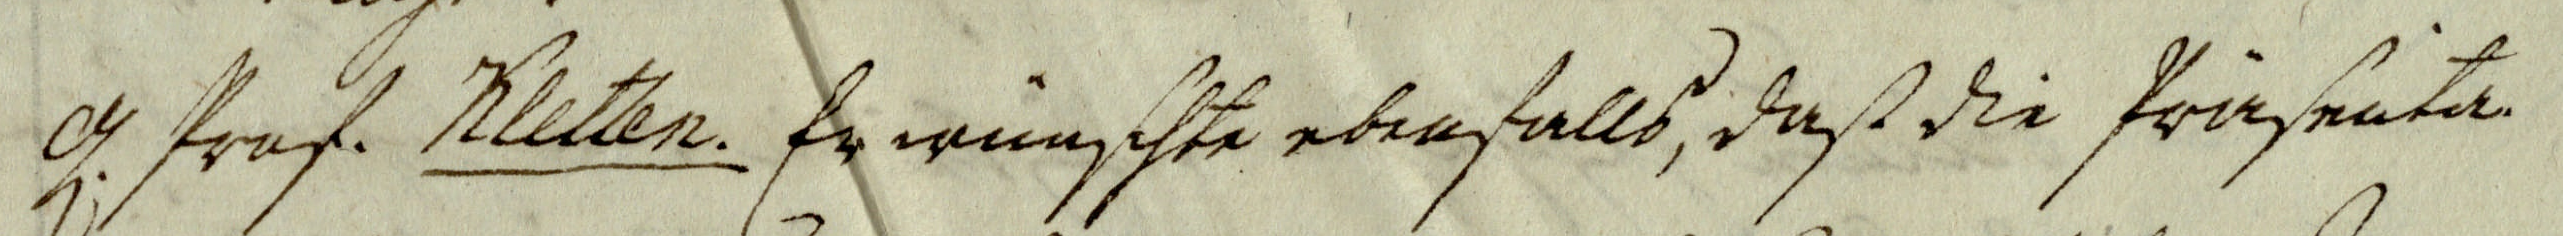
dh. Prof. Kletten. Er wünschte ebenfalls, daß die Präsenta¬
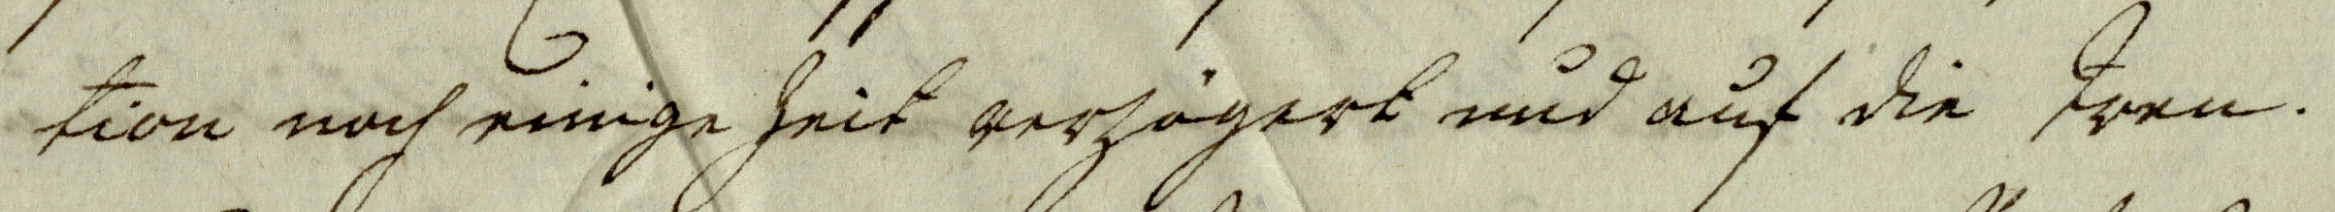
tion noch einige Zeit verzögert und auf die Tren¬
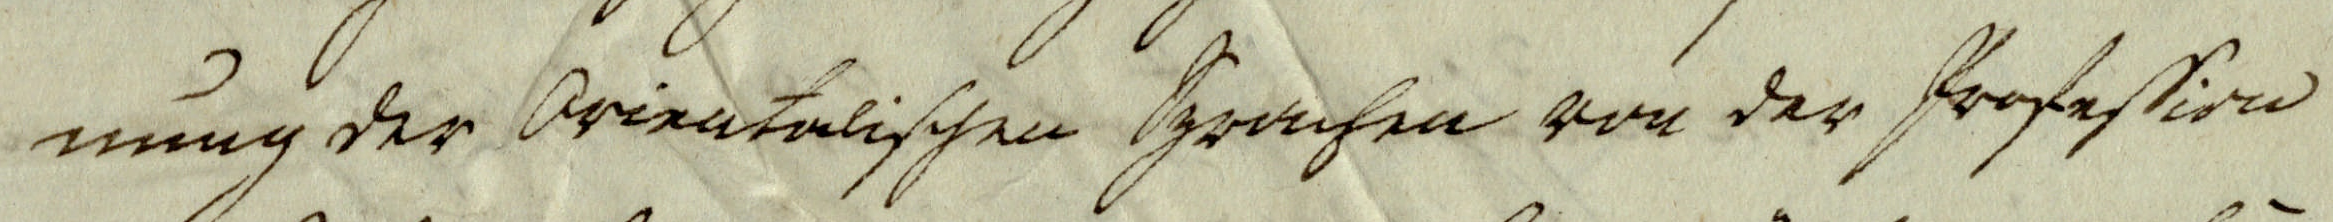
nung der Orientalischen Sprachen von der Profession
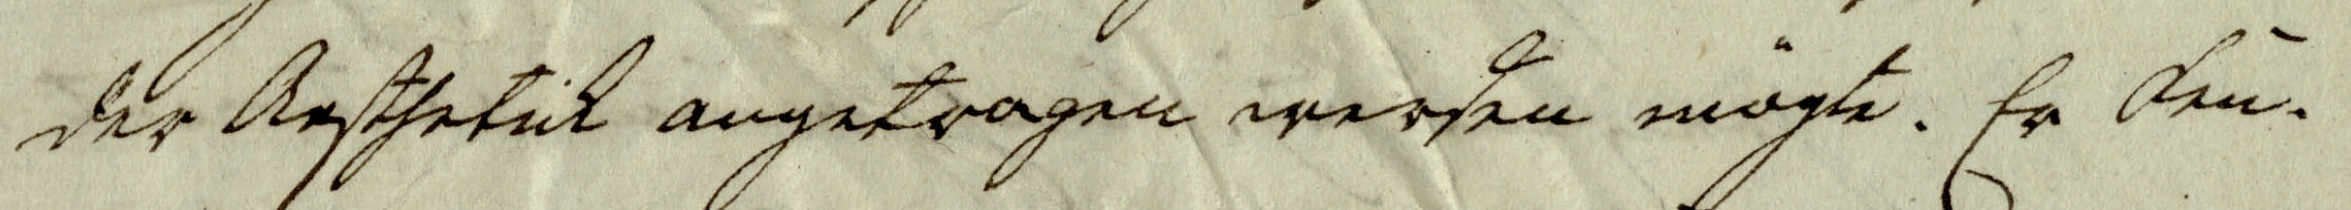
der Aesthetick angetragen werden mögte. Er ken¬
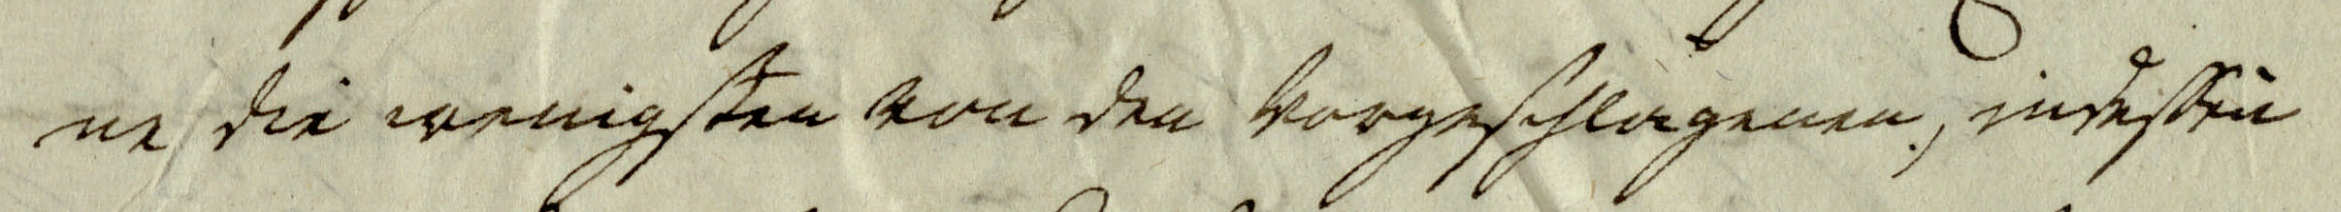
ne die wenigsten von den vorgeschlagenen; indessen
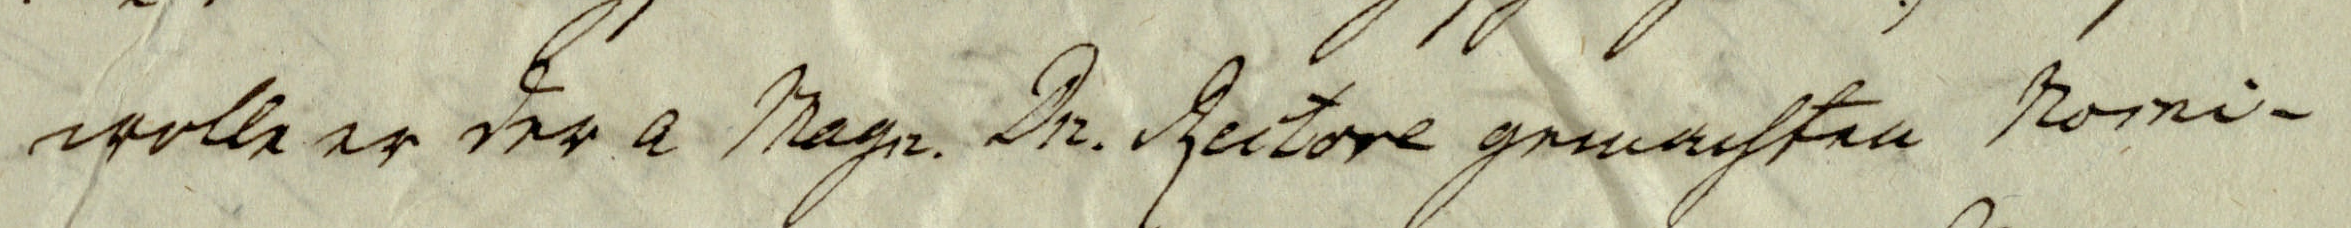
wolle er der a Magn. Dn. Rectore gemachten Nomi¬
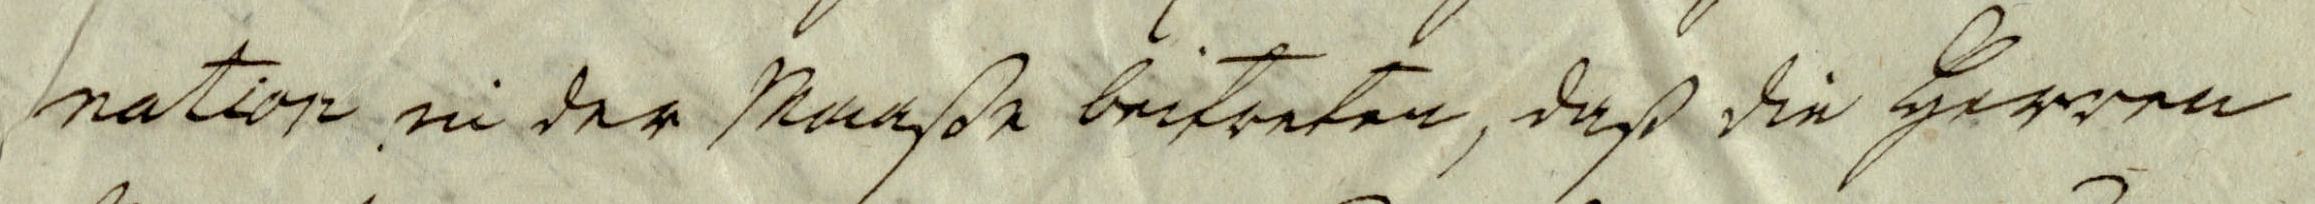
nation in der Maaße beitreten, daß die Herren
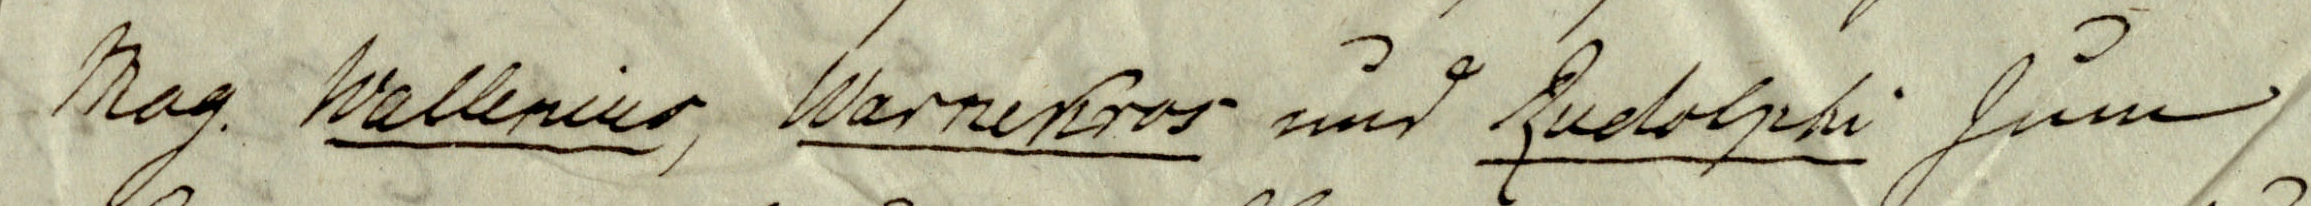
Mag. Wallenius, Warneckros und Rudolphi zum
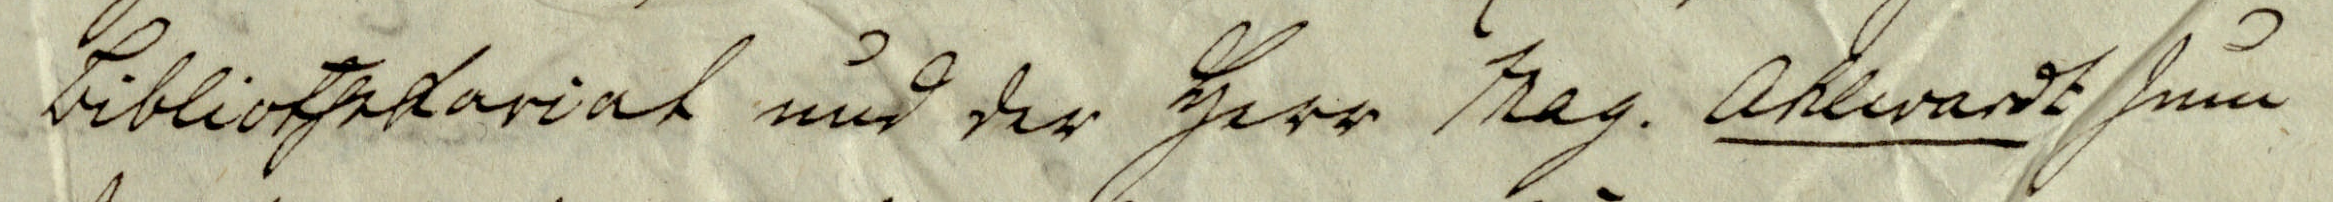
Bibliothekariat und der Herr Mag. Ahlwardt zum
